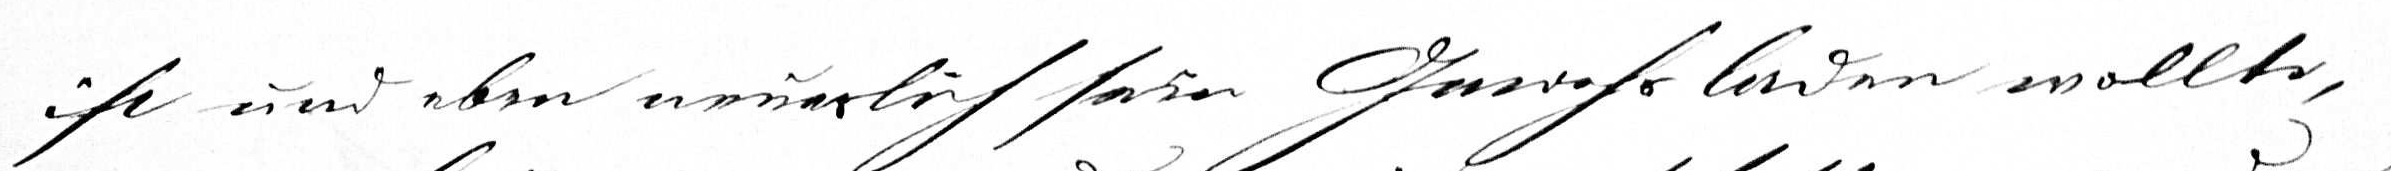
ist und eben neuerlich sein Gewehr laden wollte,
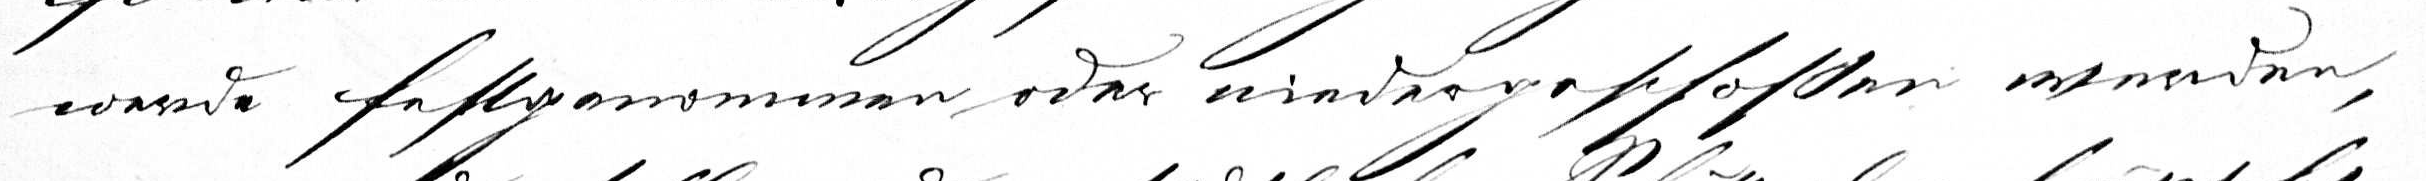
werde festgenommen oder wiedergeschossen werden,
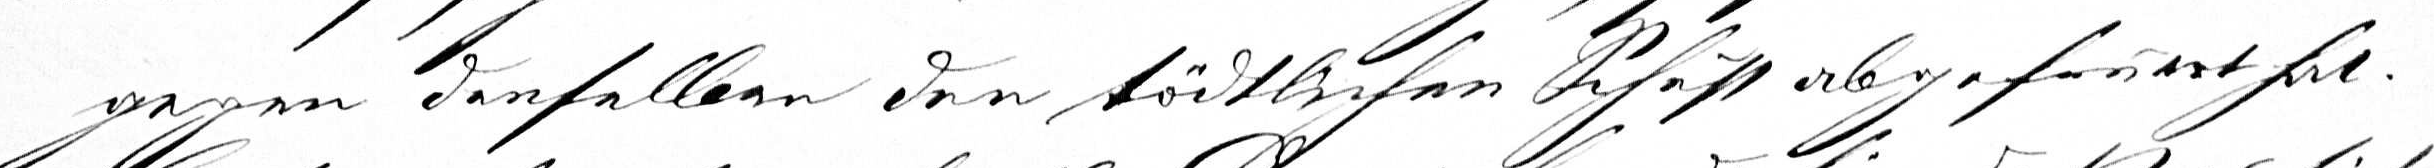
gegen denselben den tödtlichen Schuß abgefeuert hat.
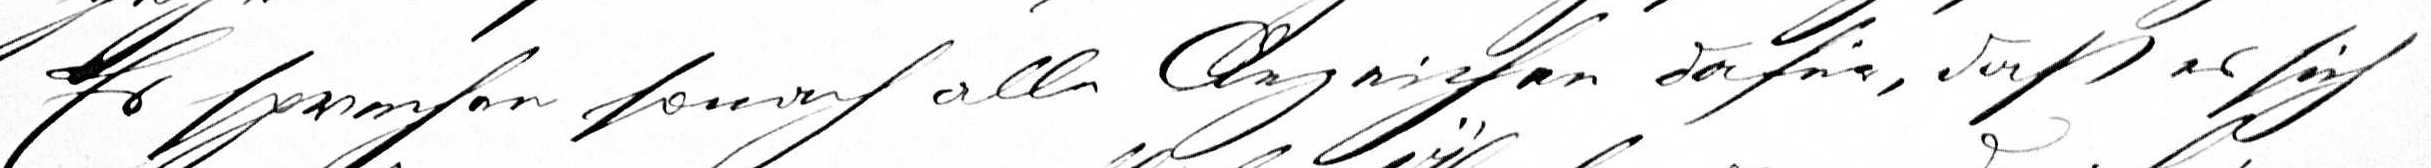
Es sprechen sonach alle Anzeichen dafür, daß es sich
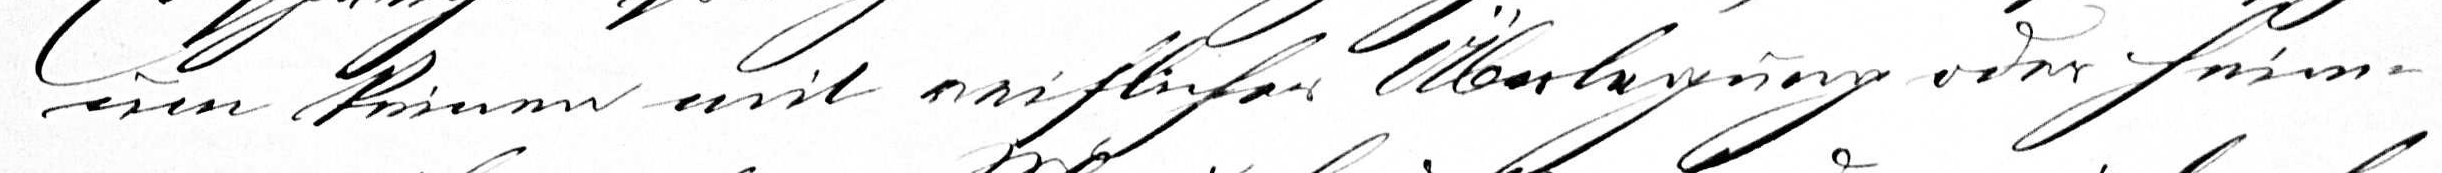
um keinen mit reiflicher Überlegung oder heim¬
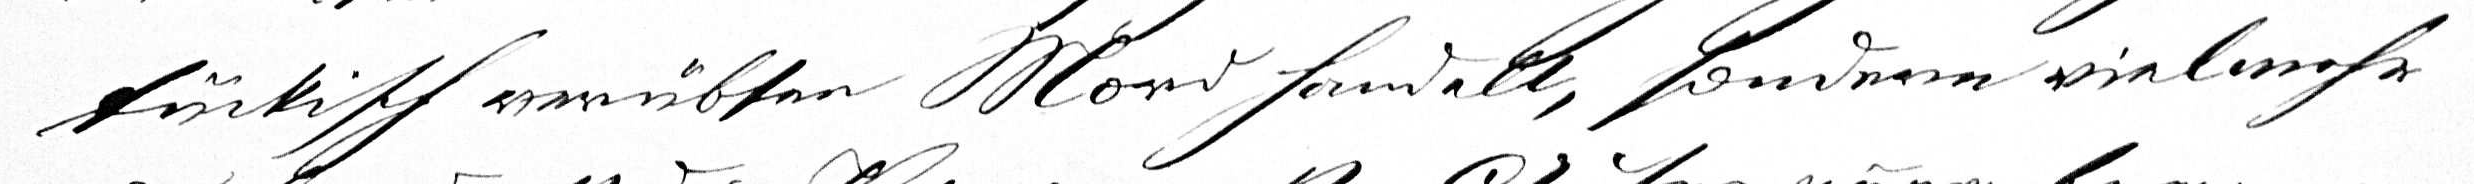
tückisch verübten Mord handelt, sondern vielmehr
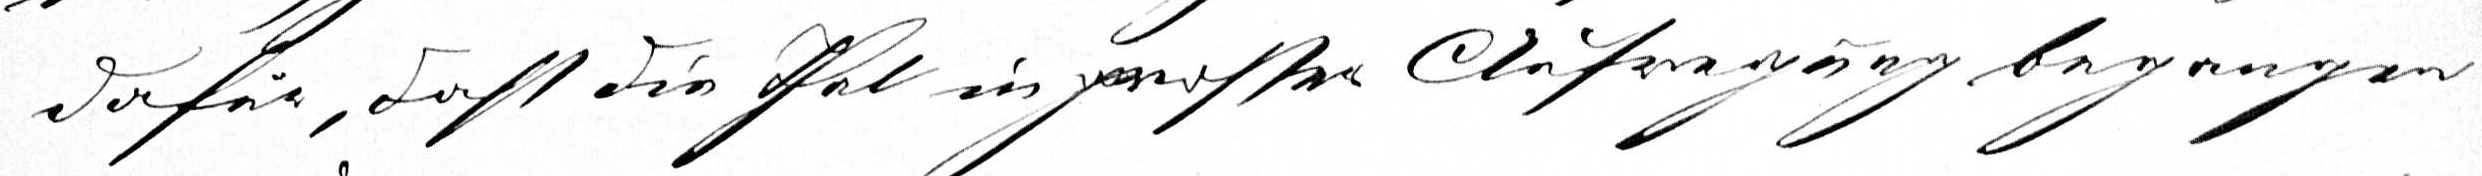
dafür, daß die That in großer Aufregung begangen
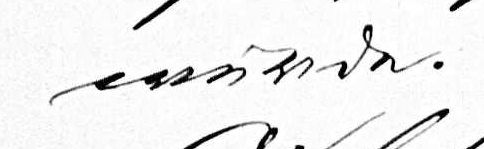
wurde.
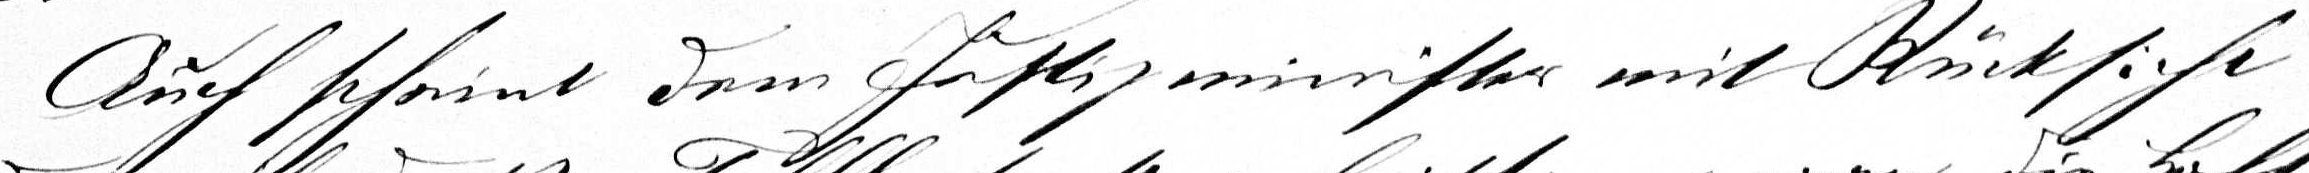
Auch scheint dem Justizminister mit Rücksicht
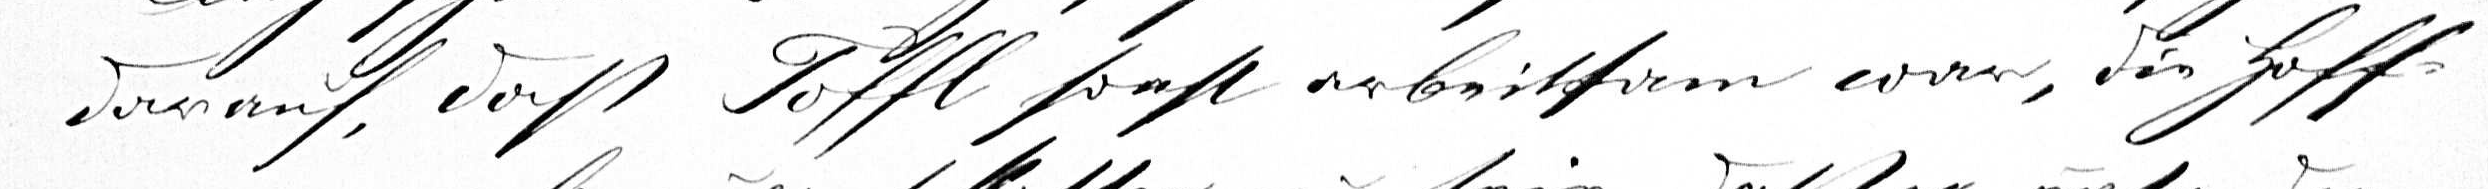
darauf, daß Toffl sonst arbeitsam war, die Hoff¬
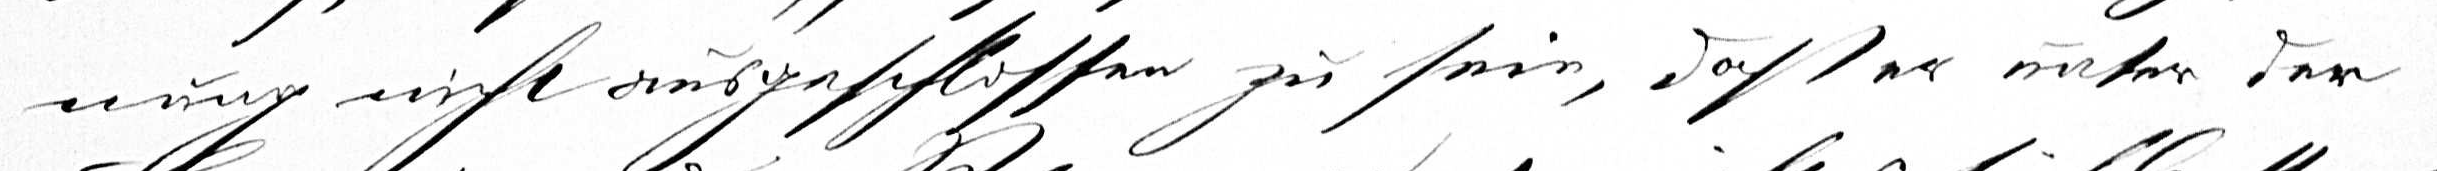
nung nicht ausgeschlossen zu sein, daß er unter der
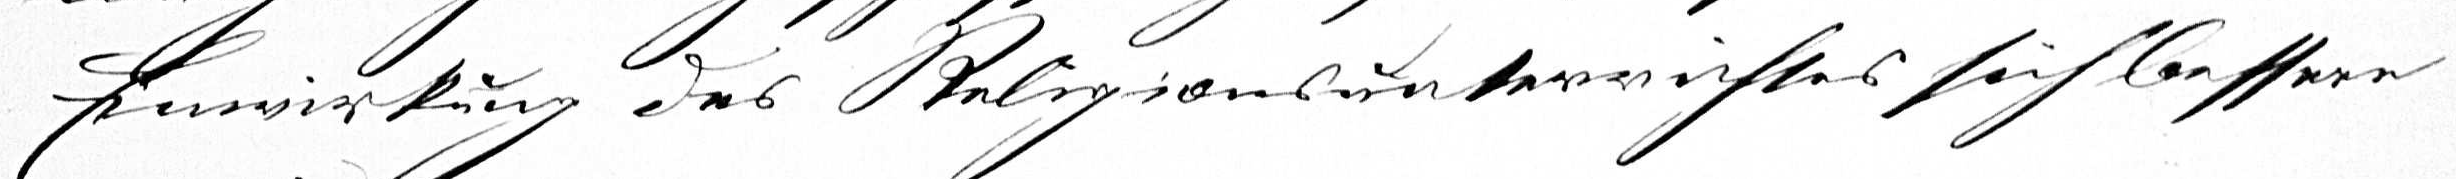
Erwirkung des Religionsunterrichtes sich bessern
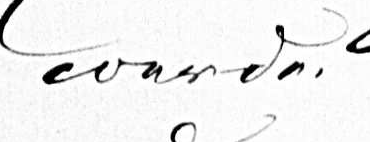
werde.
